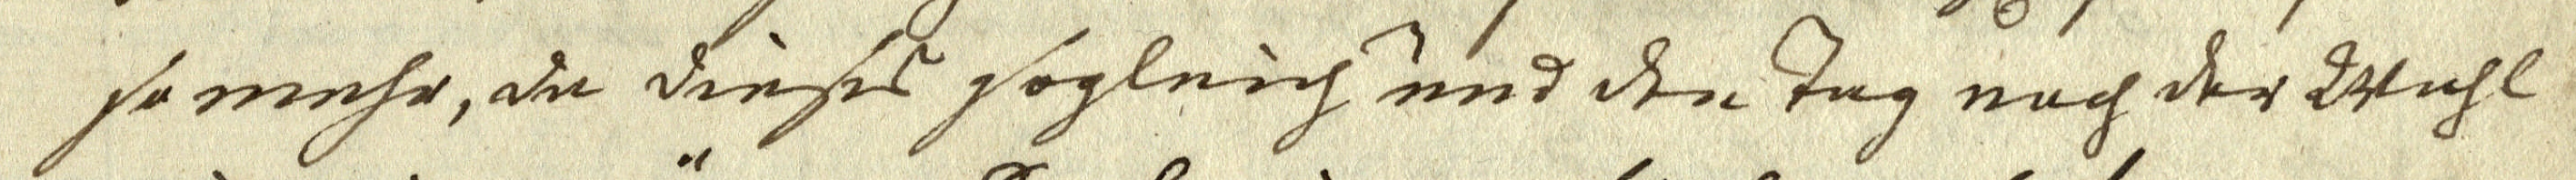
so mehr, da dieses sogleich und den Tag nach der Wahl
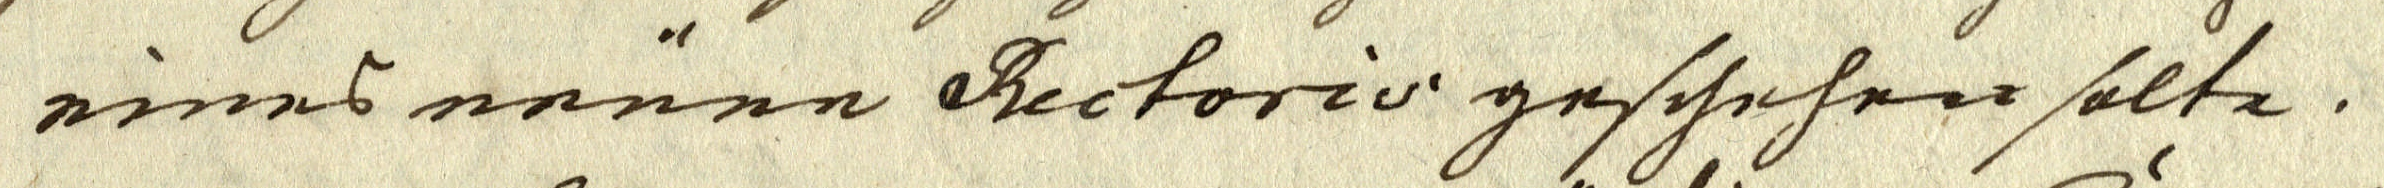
eines neuen Rectoris geschehen solte.
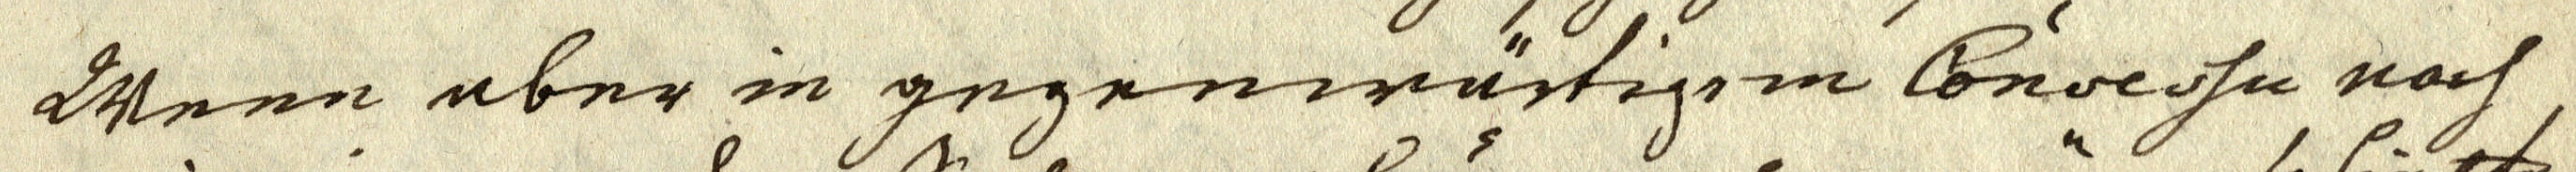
Wenn aber in gegenwärtigem Consessu noch
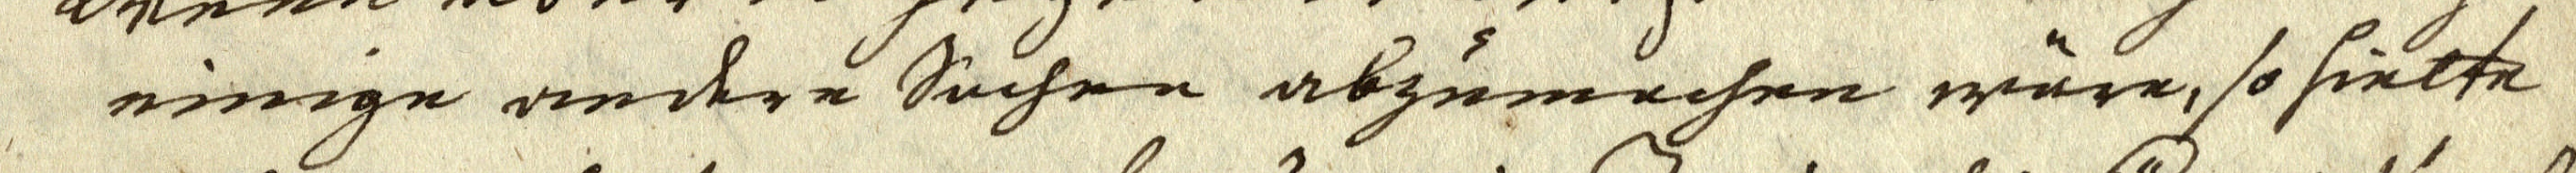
einige andere Sachen abzumachen wäre, so hielte
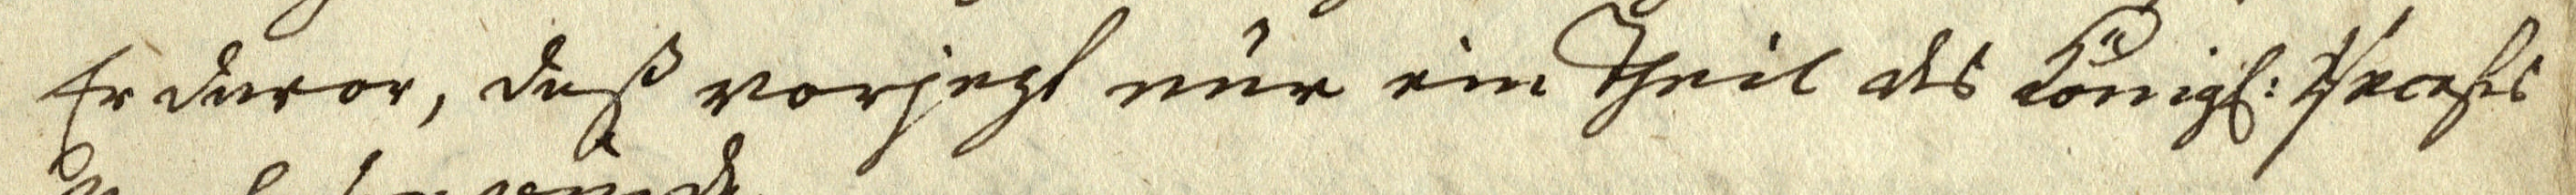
Er davor, daß vorjezt nur ein Theil des Königl. Receßes
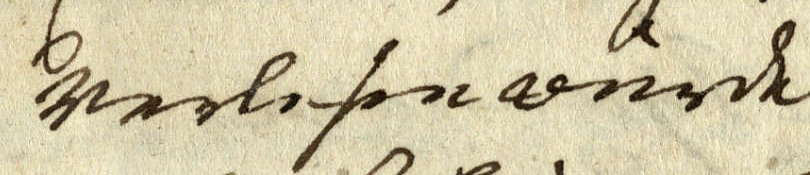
verlesen würde.
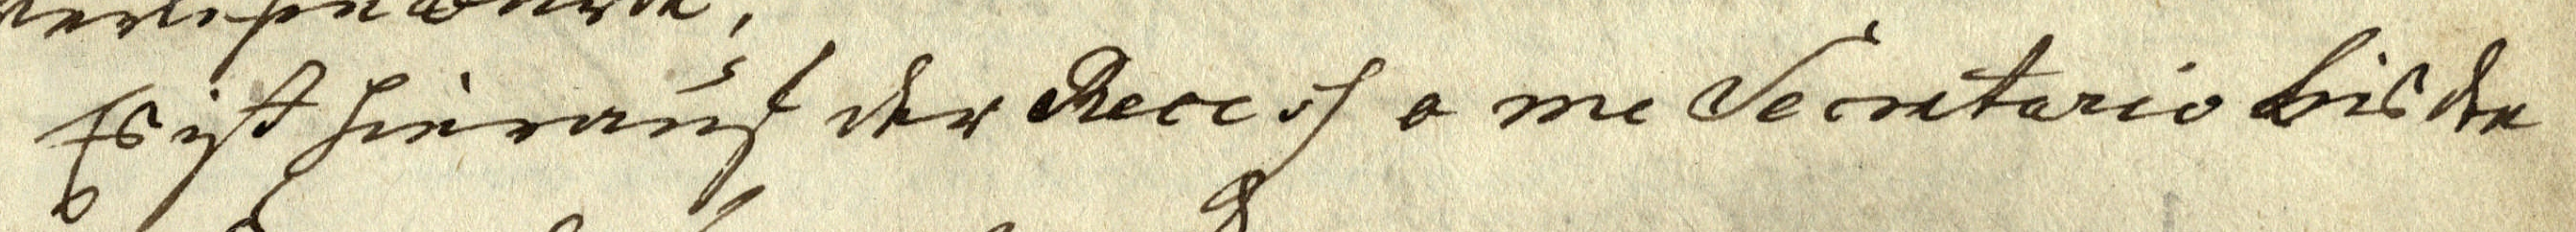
Es ist hierauf der Recess a me Secretario bis den
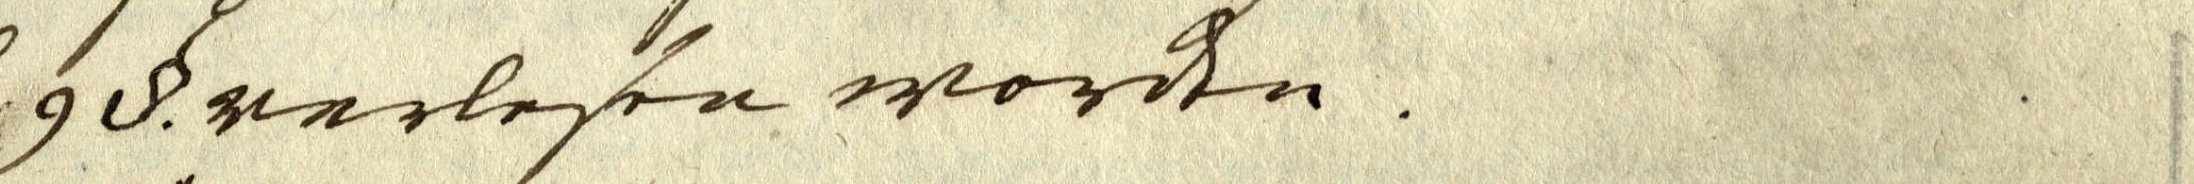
9 §. verlesen worden.
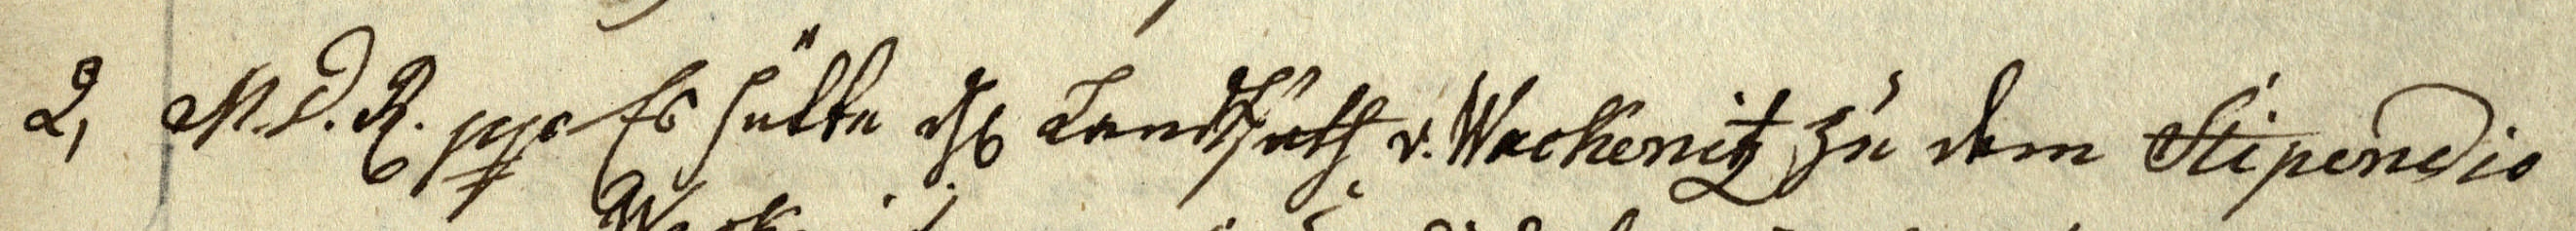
2, M. D. R. ppt. Es hätte dh. LandRath v. Wackenitz zu dem Stipendio
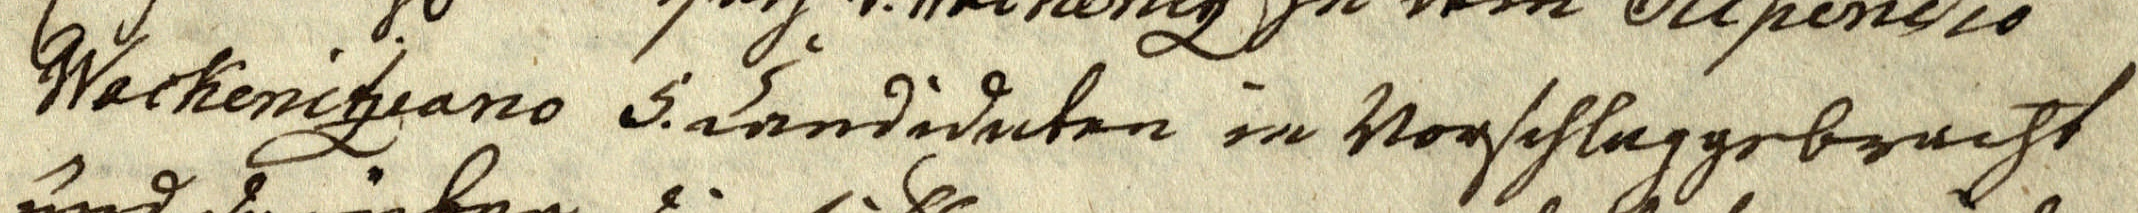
Wackenitziano 5 Candidaten in Vorschlag gebracht
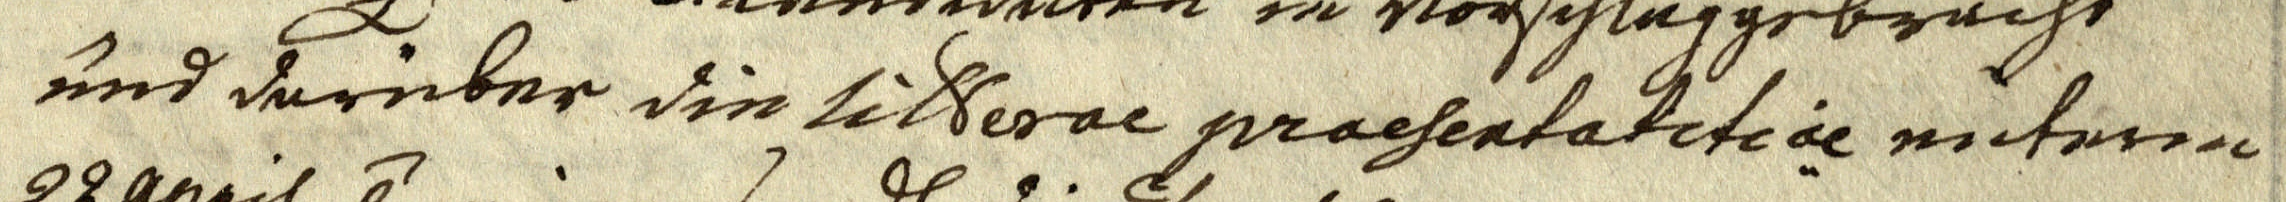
und darüber die litterae praesentatitiae unterm
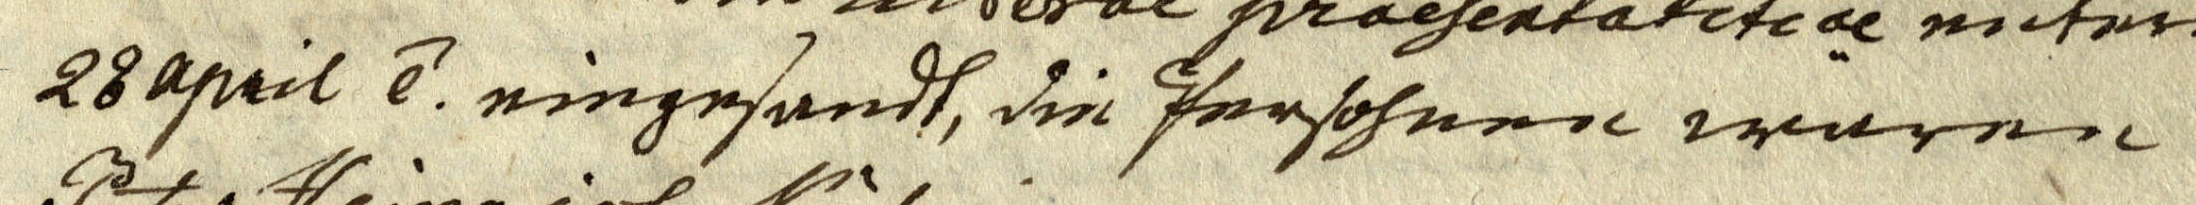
28 April ê. eindesandt, die Persohnen wären
